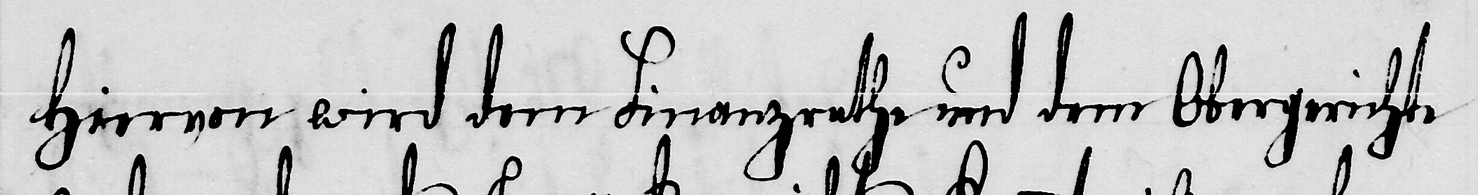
Hiervon wird dem Finanzrathe und dem Obergerichte
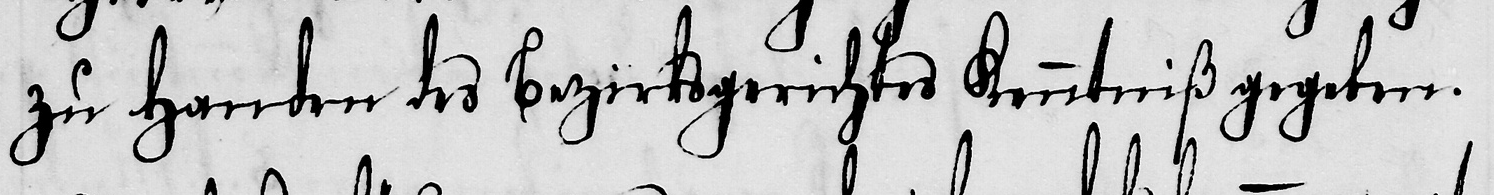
zu Handen des Bezirksgerichtes Kenntniß gegeben.
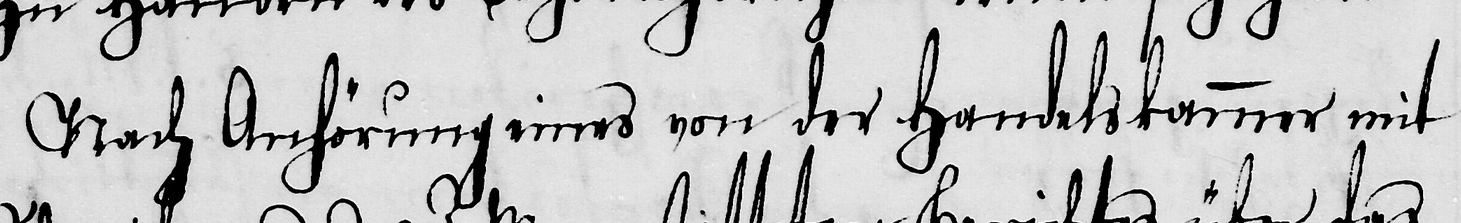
Nach Anhörung eines von der Handelskammer mit
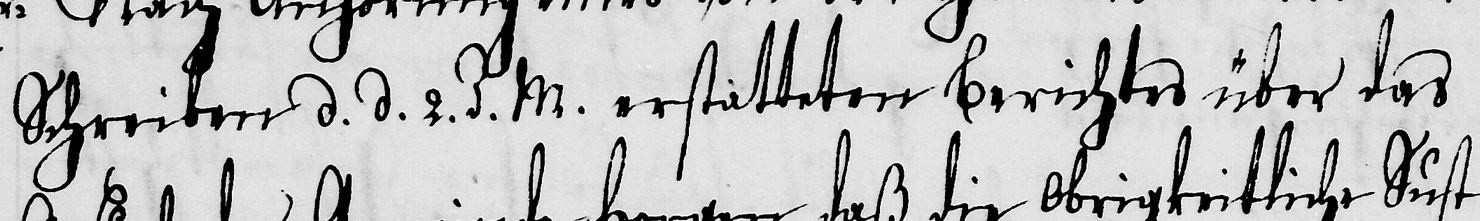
Schreiben d. d. 2. d. M. erstatteten Berichtes über das
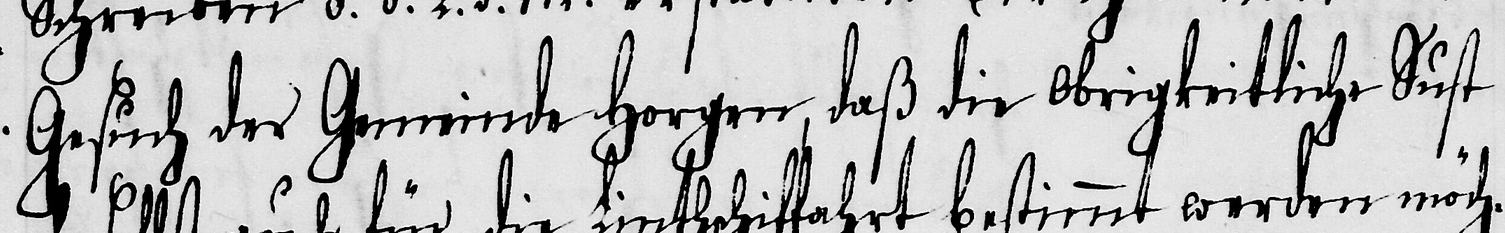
Gesuch der Gemeinde Horgen, daß die Obrigkeitliche Sust
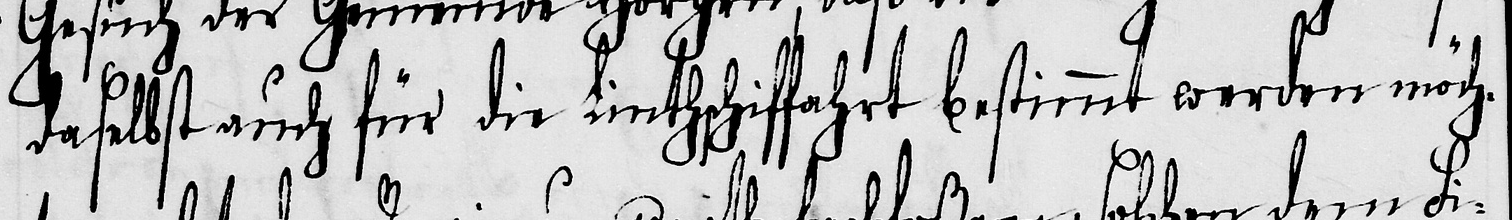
daselbst auch für die Linthschiffahrt bestimmt werden möch¬
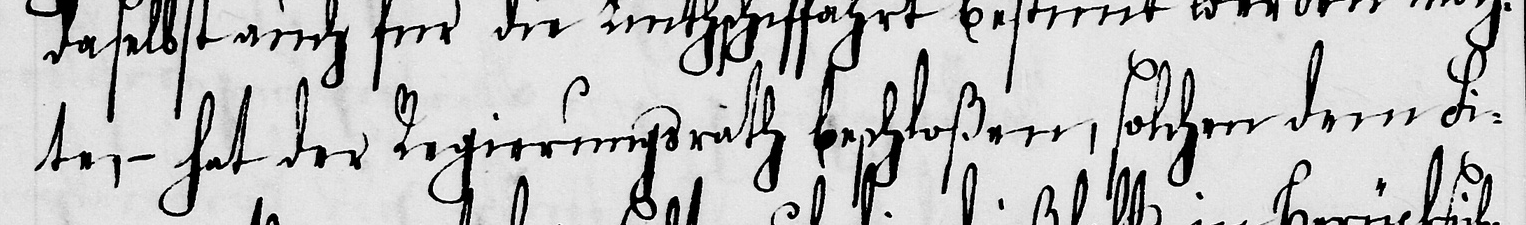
te, – hat der Regierungsrath beschloßen, solchen dem Fi¬
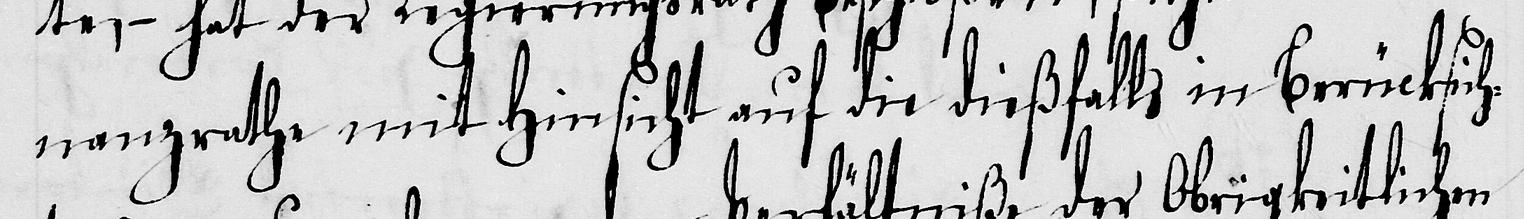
nanzrathe mit Hinsicht auf die dießfalls in Berücksic¬
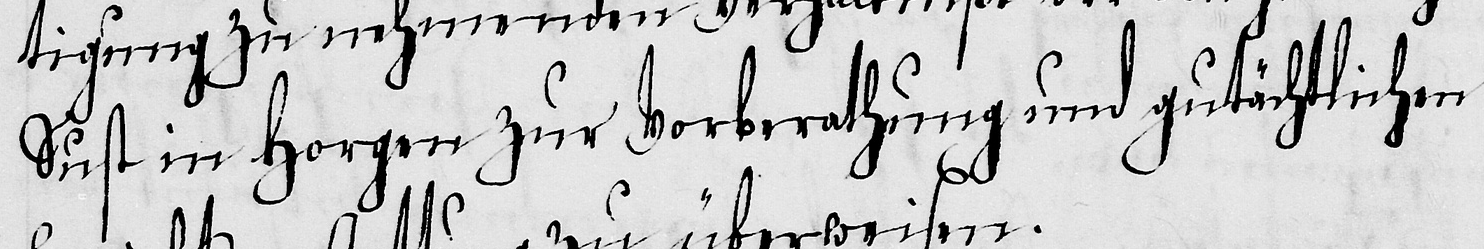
Sust in Horgen zur Vorberathung und gutächtlichen
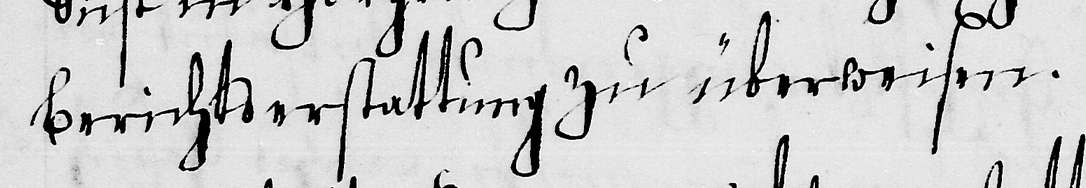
Berichtserstattung zu überweisen.
